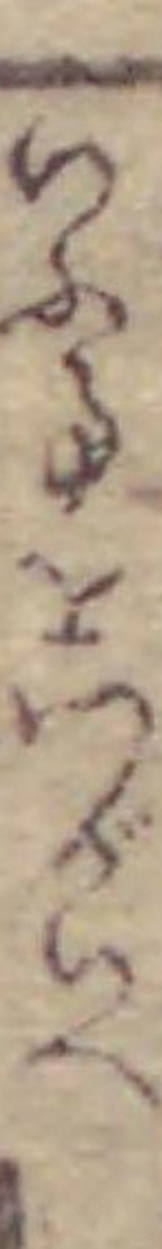いふ事をわがいへ
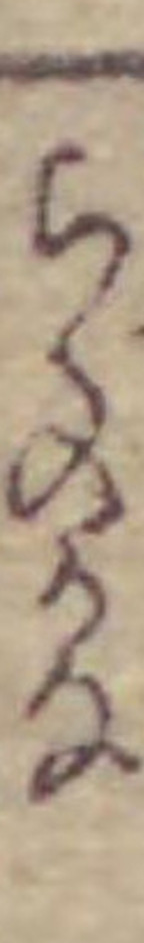らくのかな
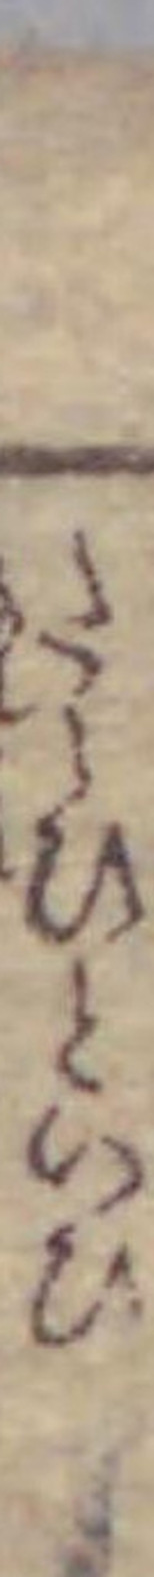たらひといひ
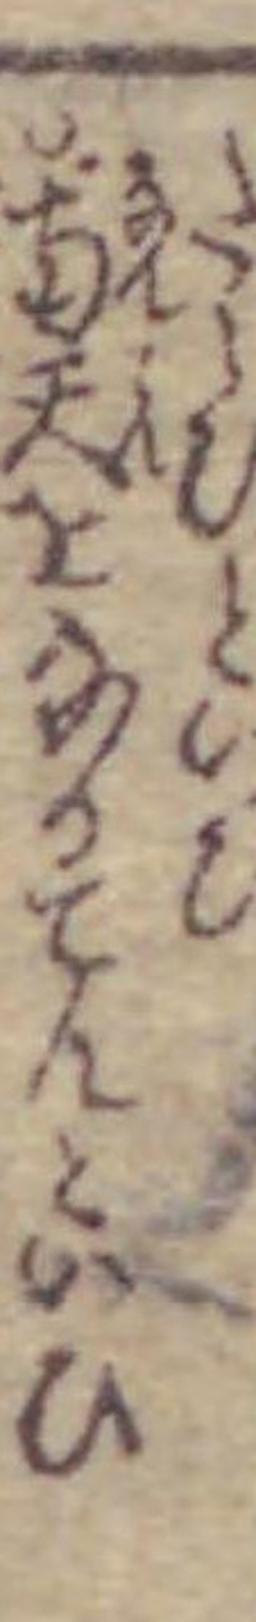○南天をなるてんといひ
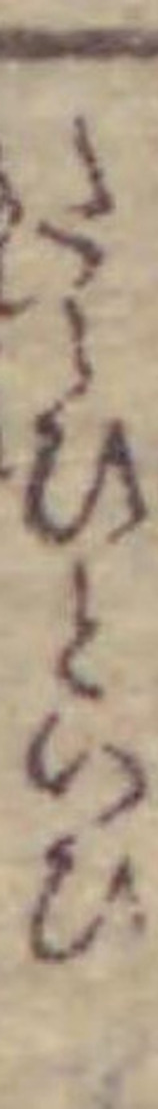たらひといひ
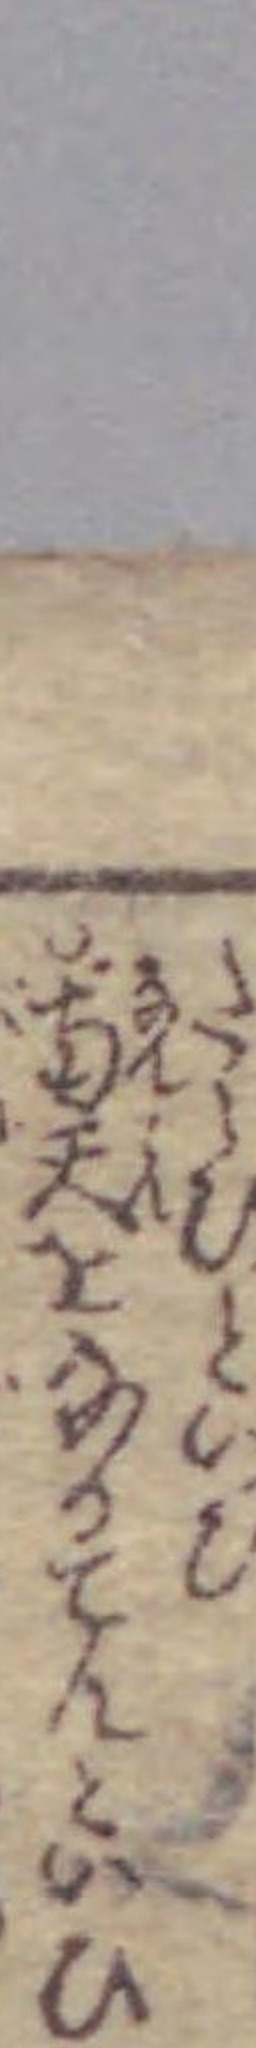○南天をなるてんといひ
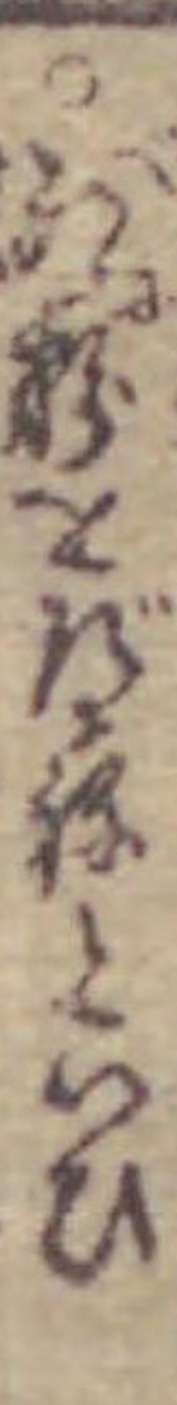○紅粉をべねといひ
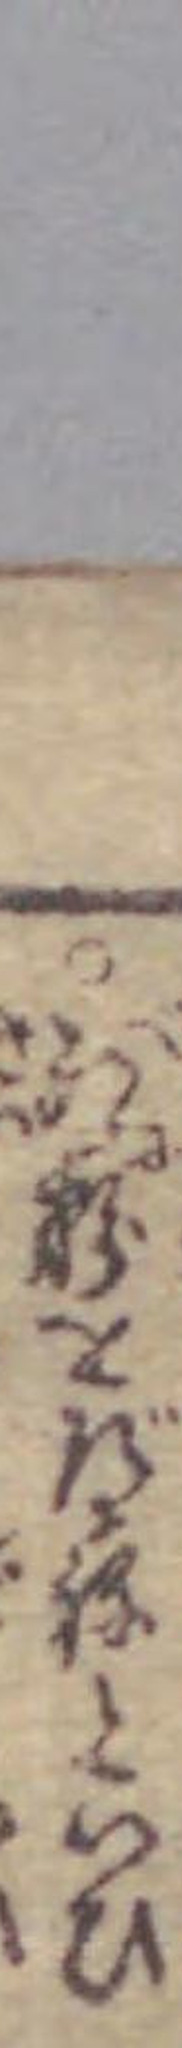○紅粉をべねといひ
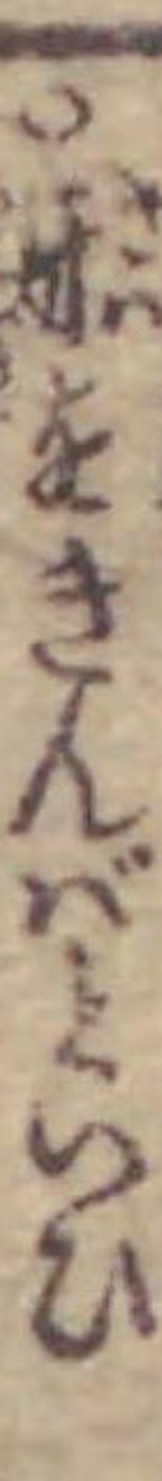○牙をきんばといひ
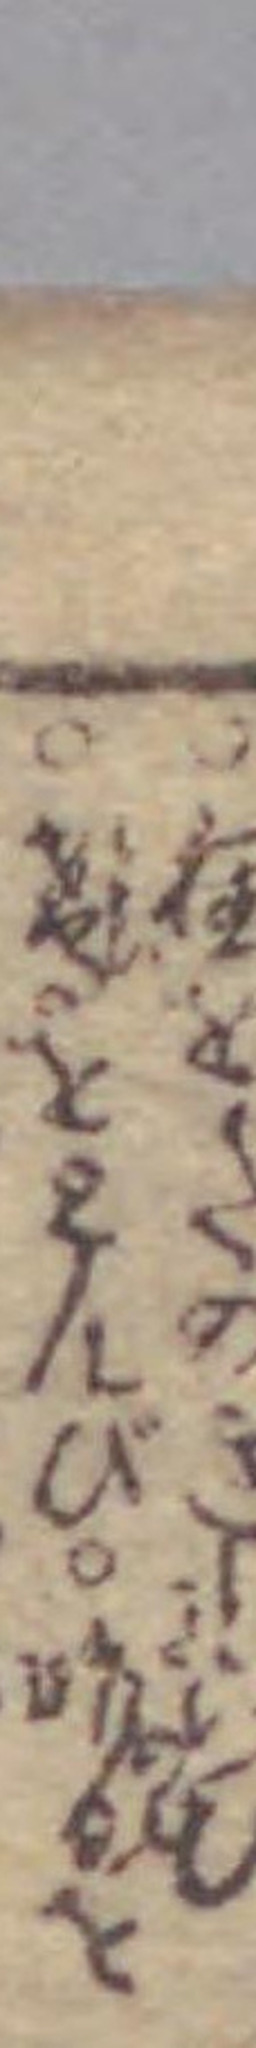○鳶をとんび○昨日を
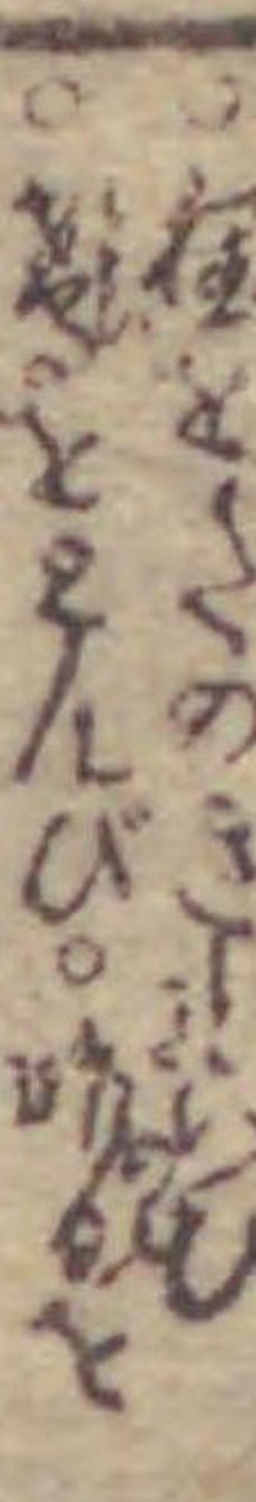○鳶をとんび○昨日を
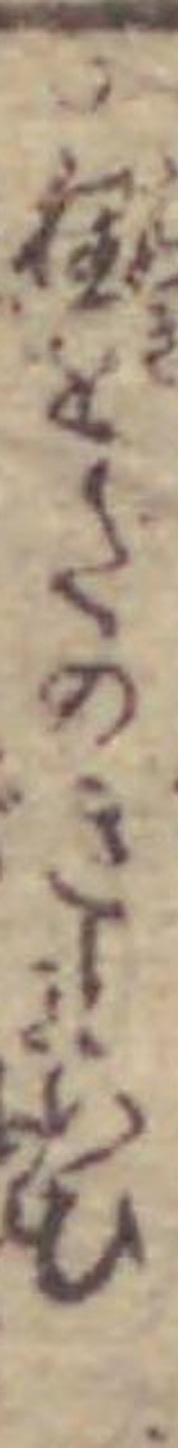○狸をたのきといひ
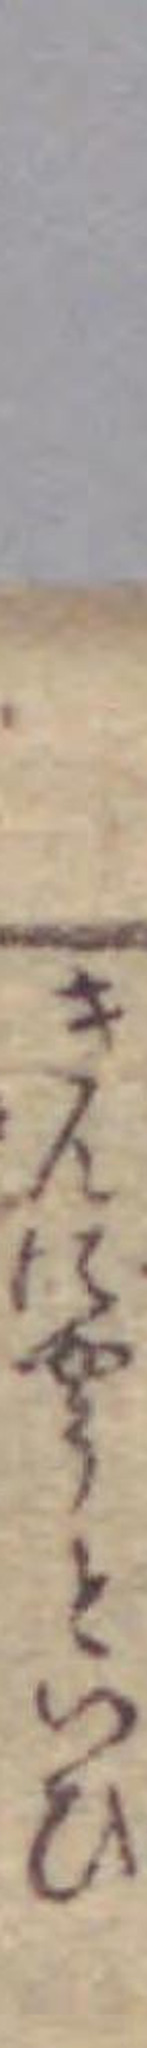きんにやうといひ
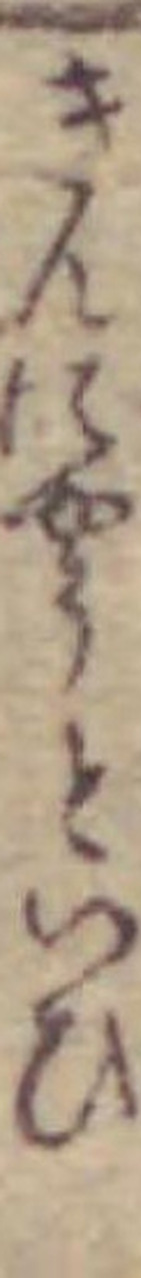きんにやうといひ
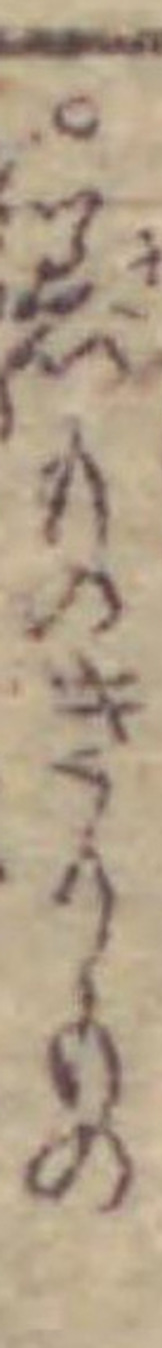○着ものきりもの
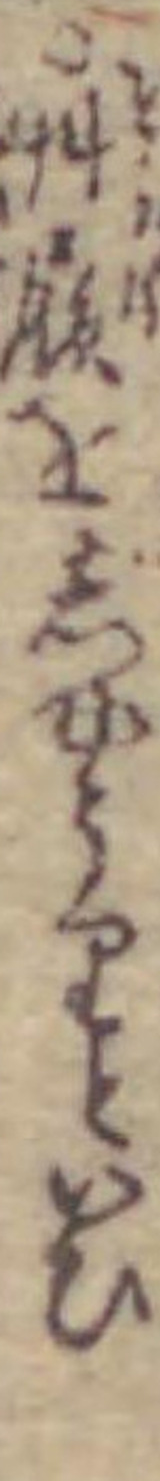○艸履をじやうりといひ
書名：和荘兵衛後日話 : 3巻
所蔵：国立国会図書館 National Diet Library, JAPAN
